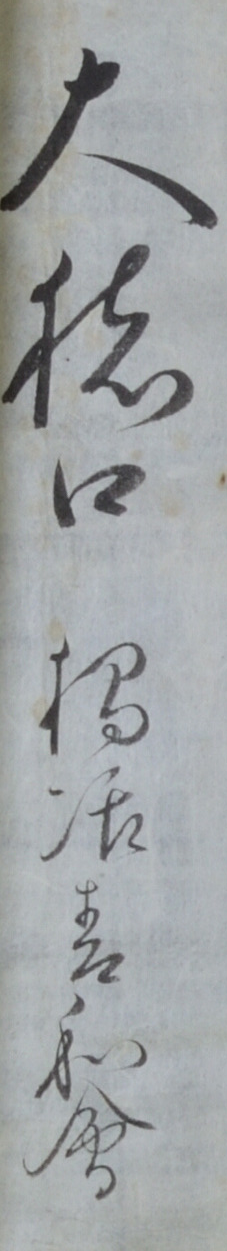大猪口揚活春和会
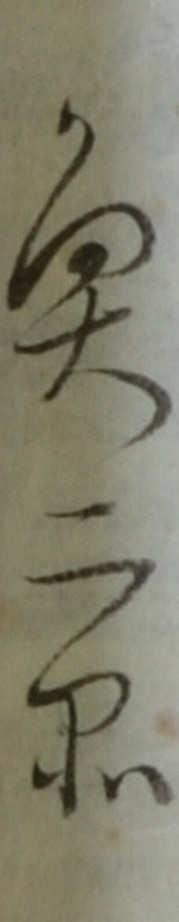魚二品
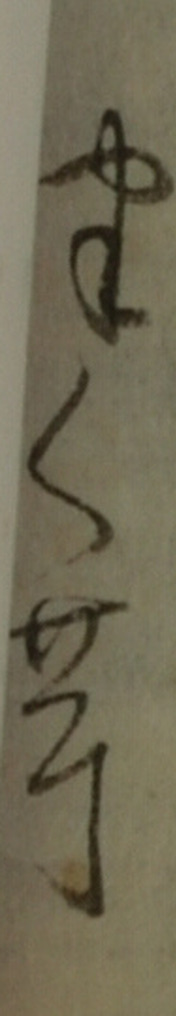つく芋

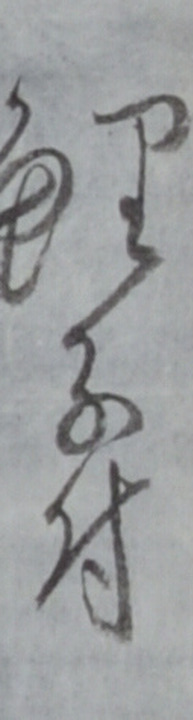鯉子付
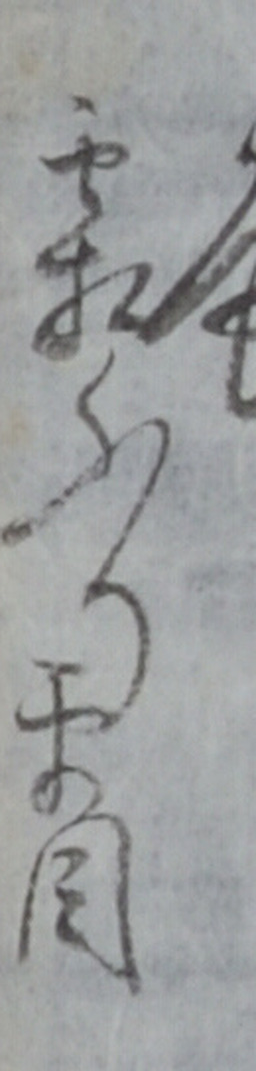霜ふり平目
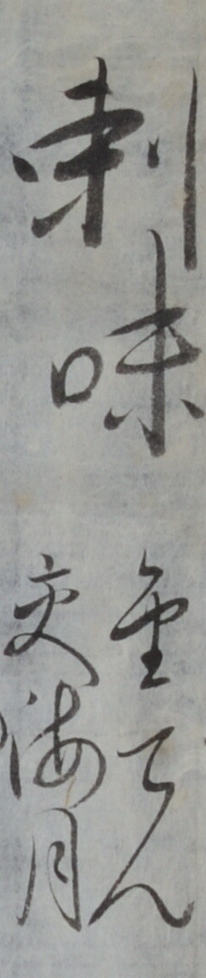刺身金てん
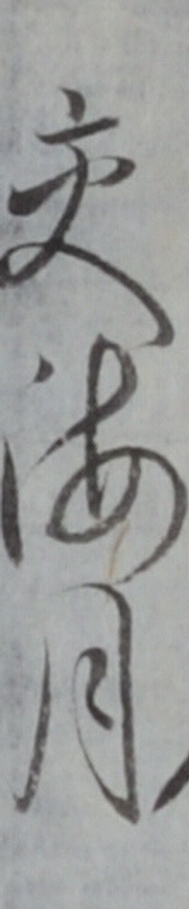交海月
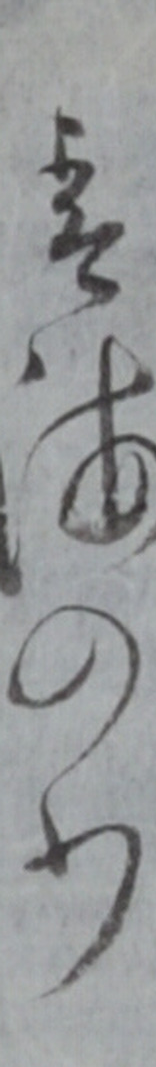青海のり
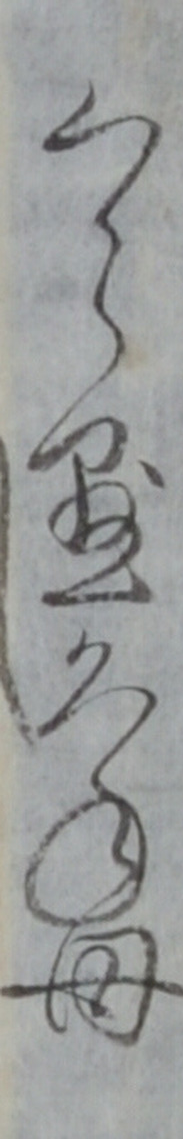くら懸久年母
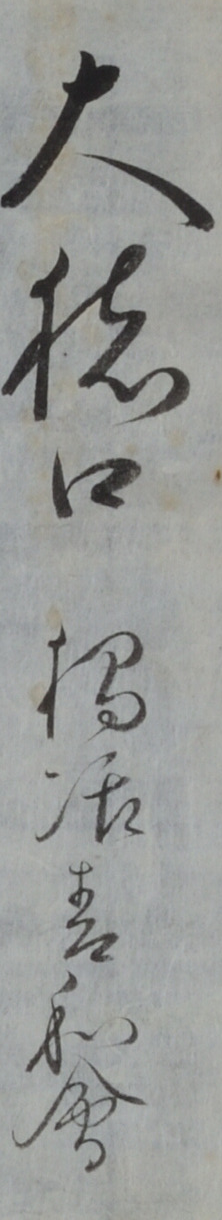大猪口揚活春和会
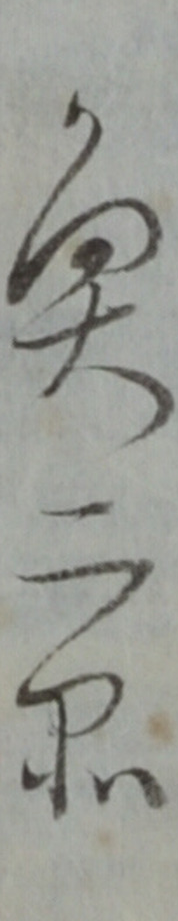魚二品
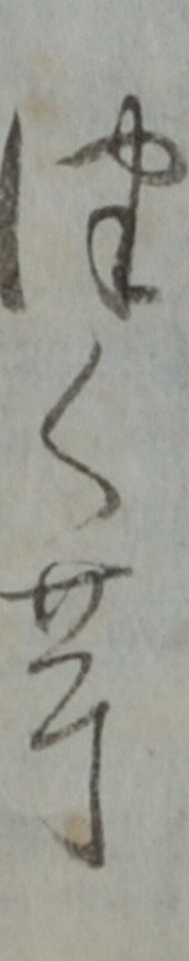つく芋
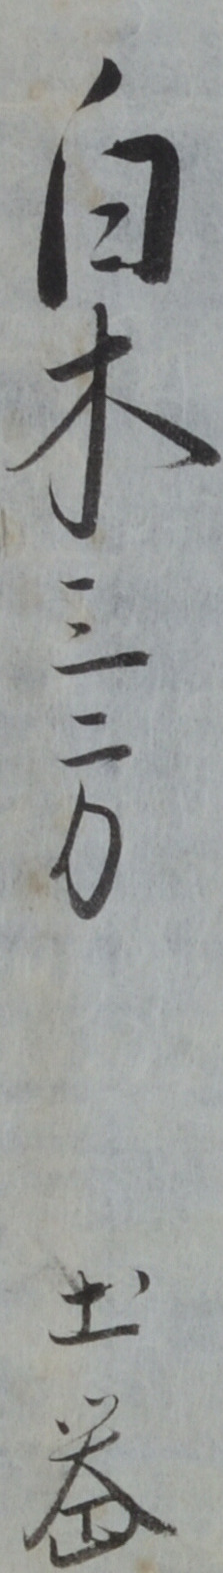白木三方土器
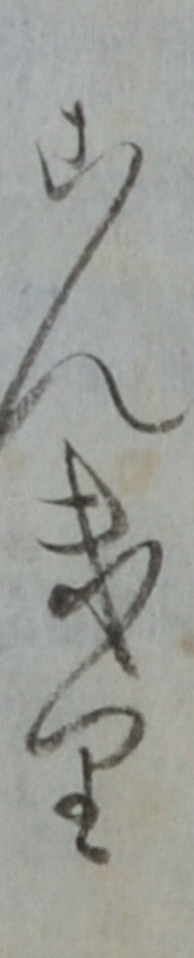こんきり
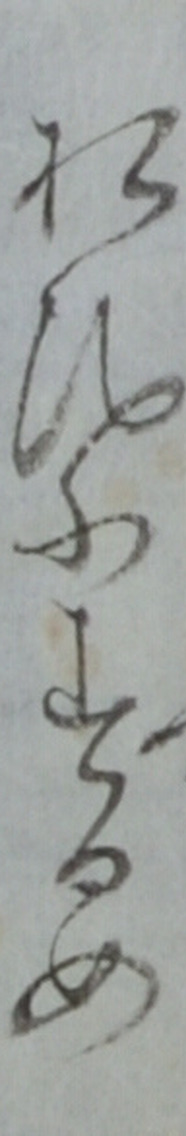松葉するめ
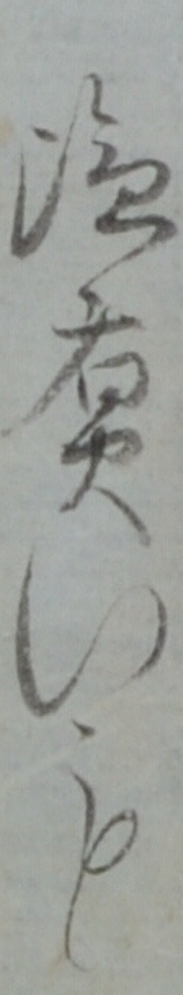塩煮いも
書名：献立書上
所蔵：伊那市立高遠町図書館・合同会社AMANE
